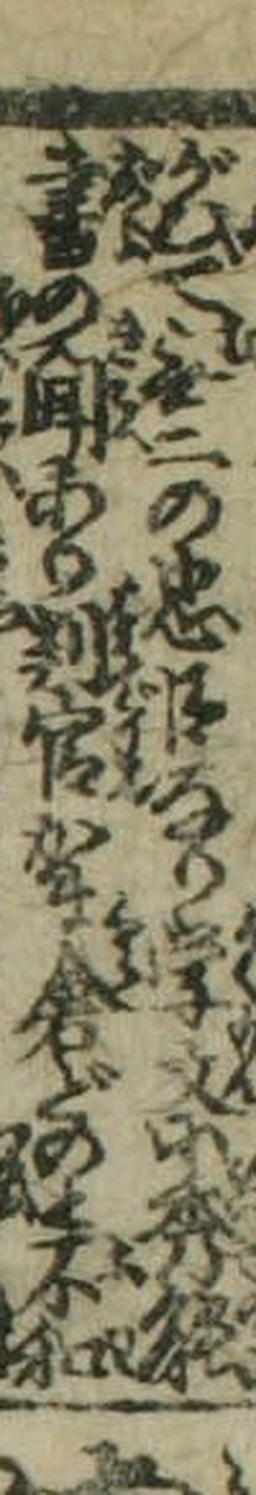書の聞あり判官かま倉どのと不和
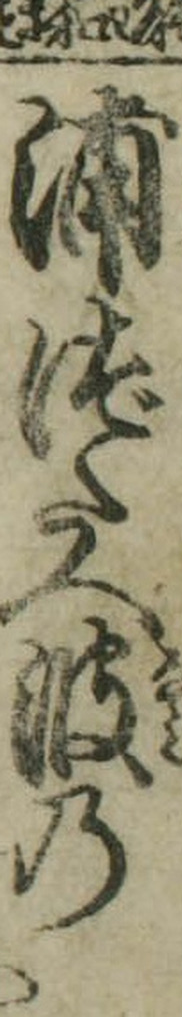浦づたへ波の
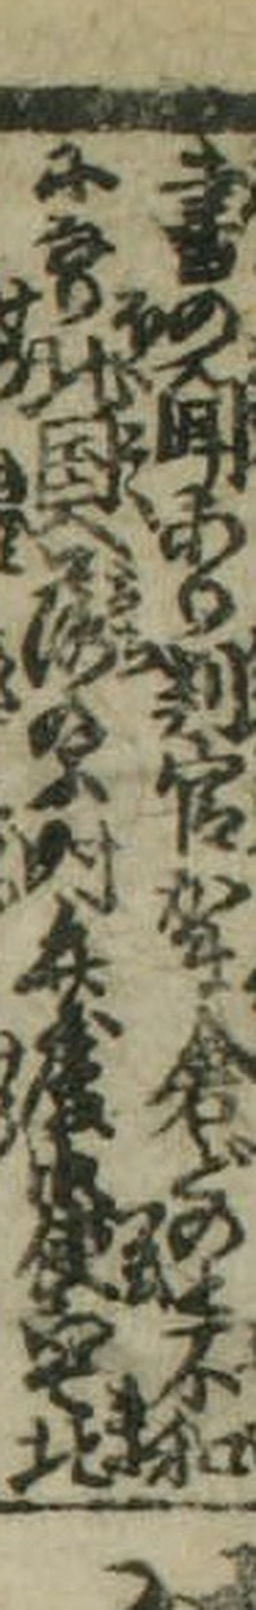になり北国へ落給ふ時弁慶御使して北
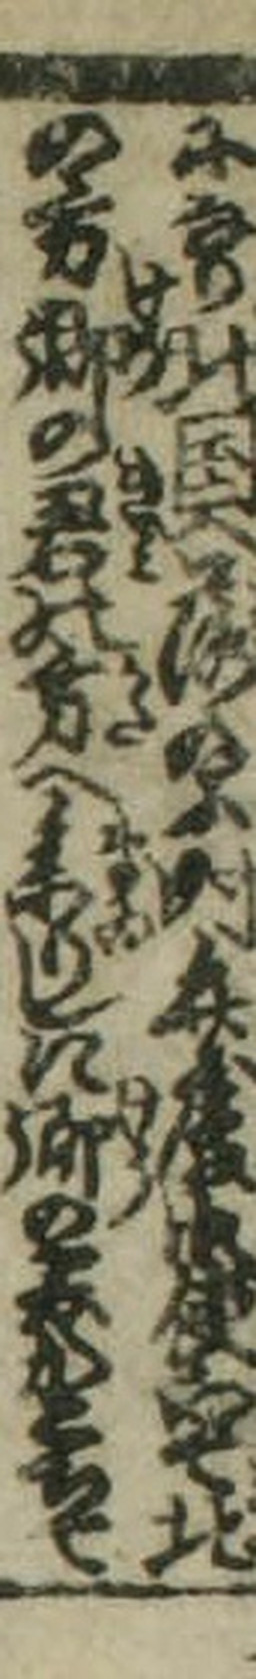の方卿の君の方へ参りしに卿の宮かこちて
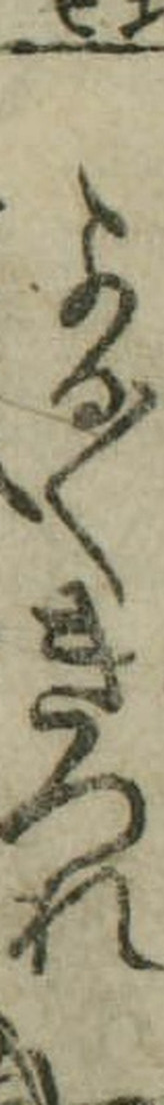よる〳〵きつれ
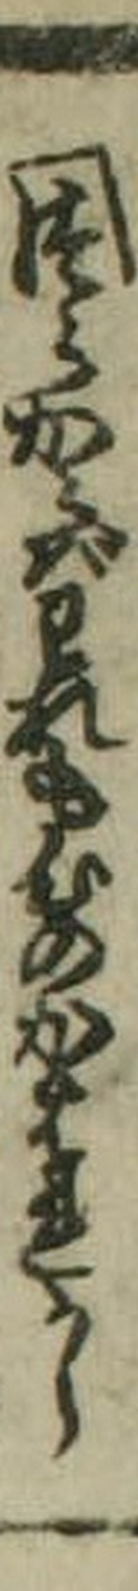〽つらからばわれも心のかはれかし
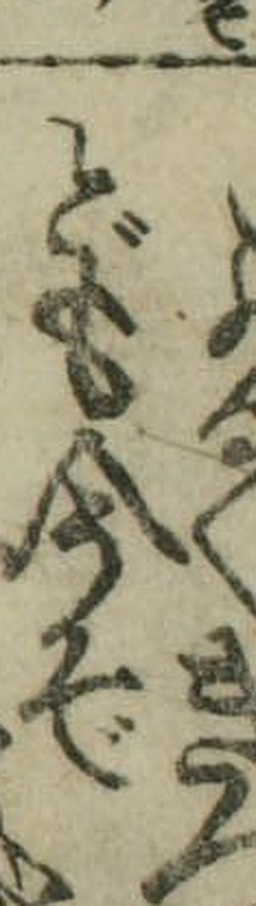ども今ぞ
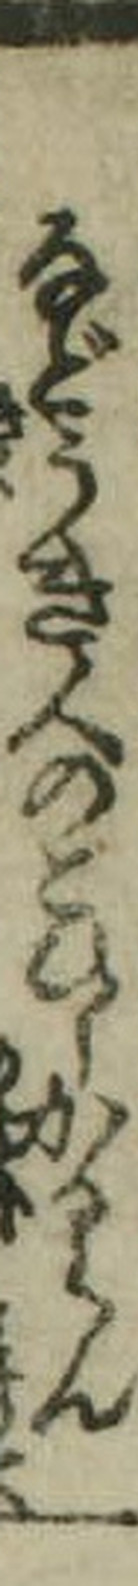などうき人のこひしかるらん
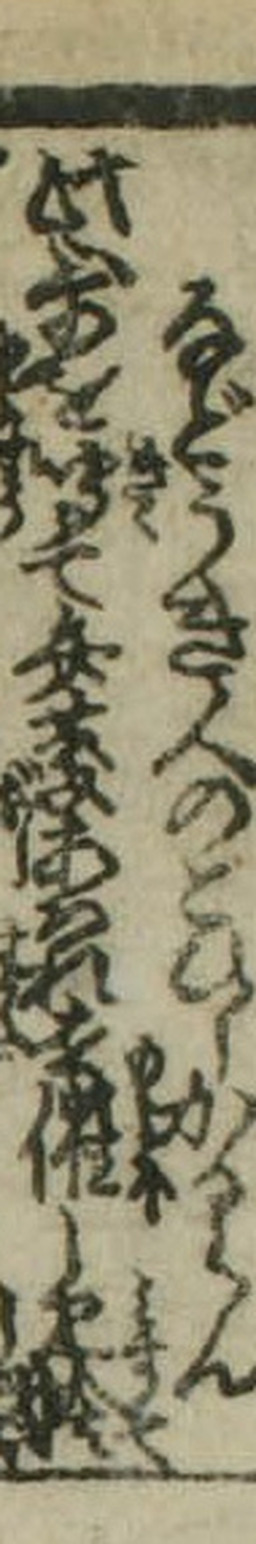此歌を聞て弁慶あはれを催し見捨
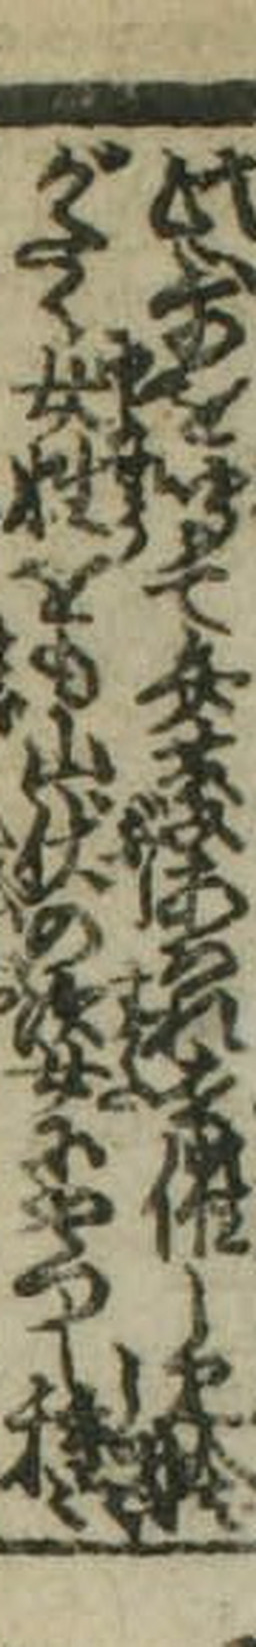がたく女性をも山伏の姿にやつし種々
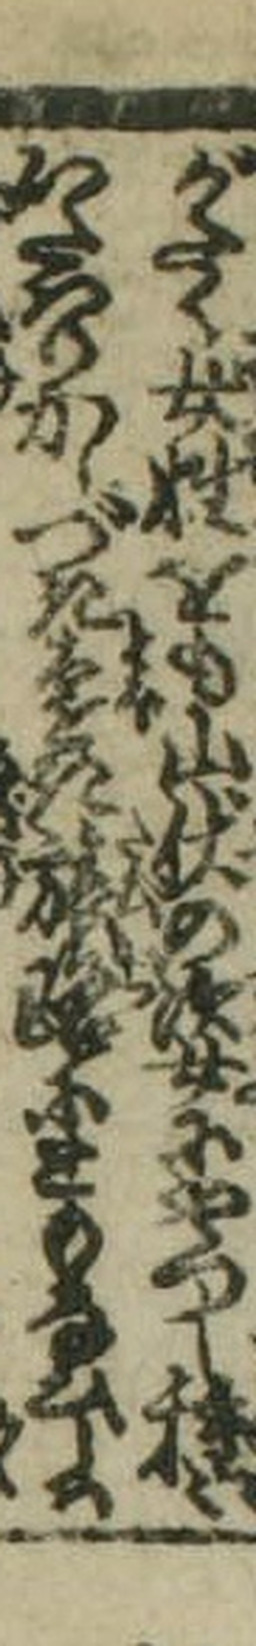いたはりかしづき遠き旅路にともなひしは
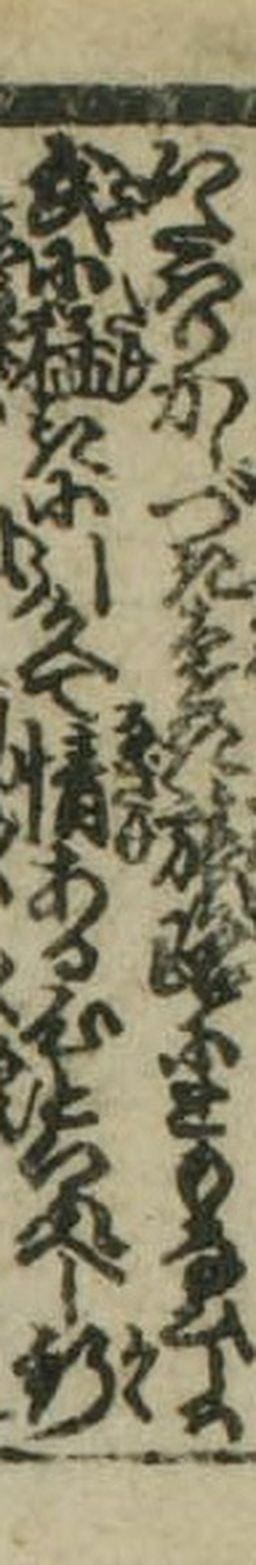武に猛きに引かへて情ある心といふへし斯
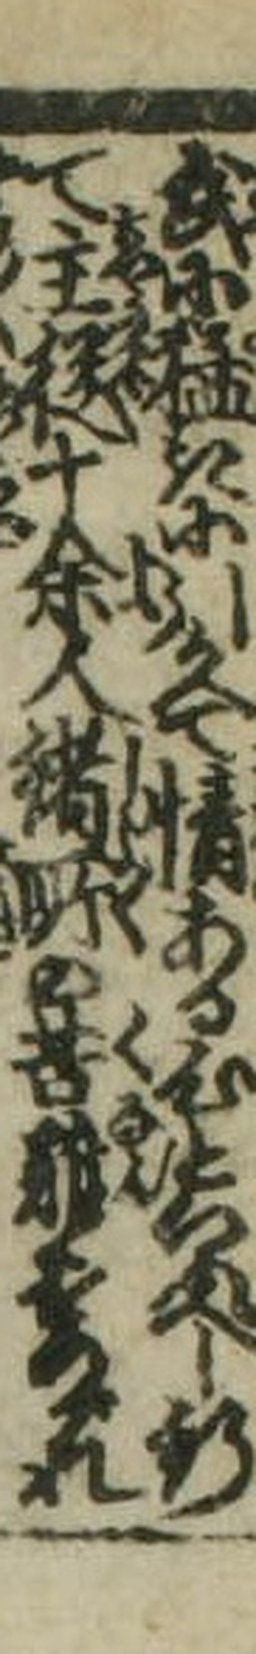て主従十余人諸所の苦難をのがれ
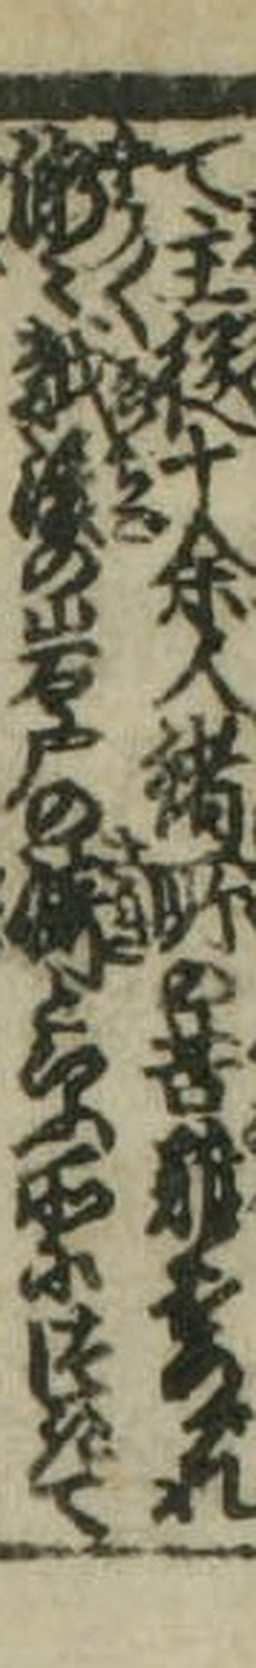漸々越後の岩戸の崎といふ所につきて
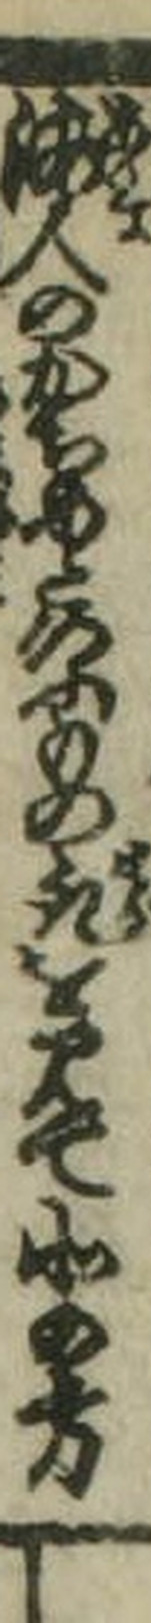海人のかちめといふもの取を見て北の方
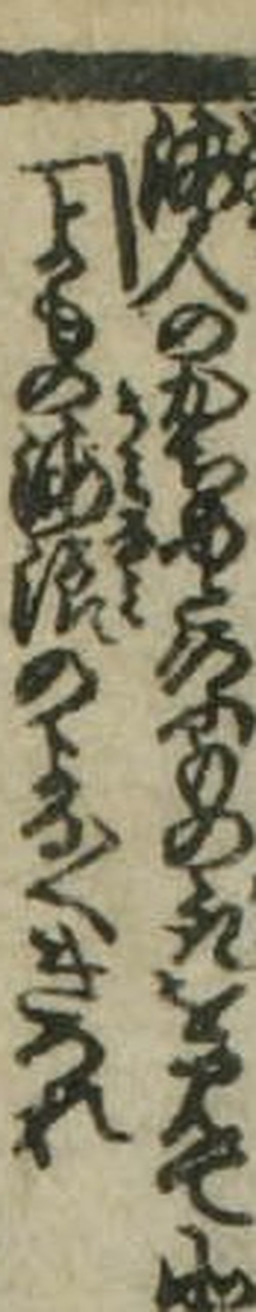〽よもの海浪のよる〳〵きつれ
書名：續英雄百人一首
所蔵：東京学芸大学附属図書館
